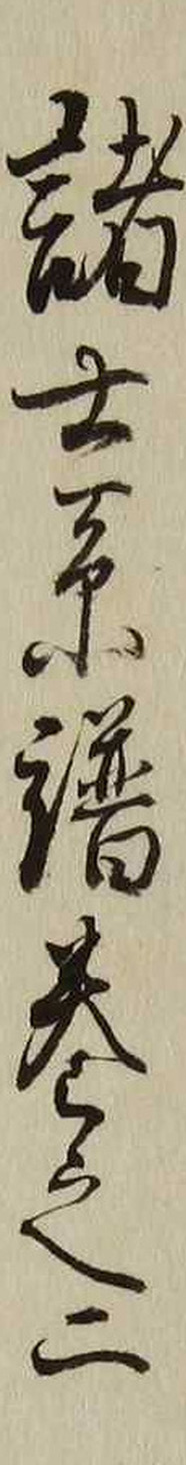諸士系譜巻之二
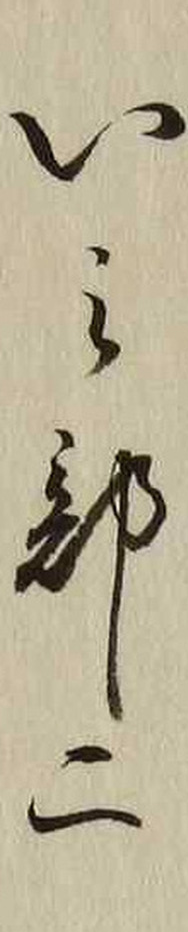い之部二
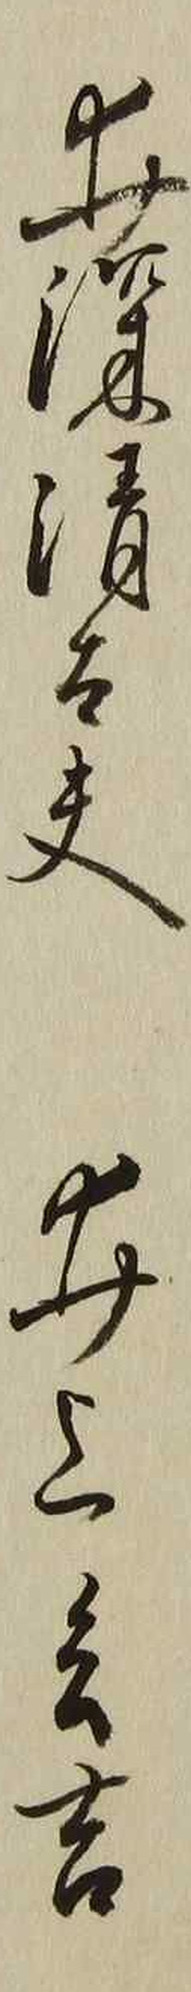井深清太夫井上兵吉

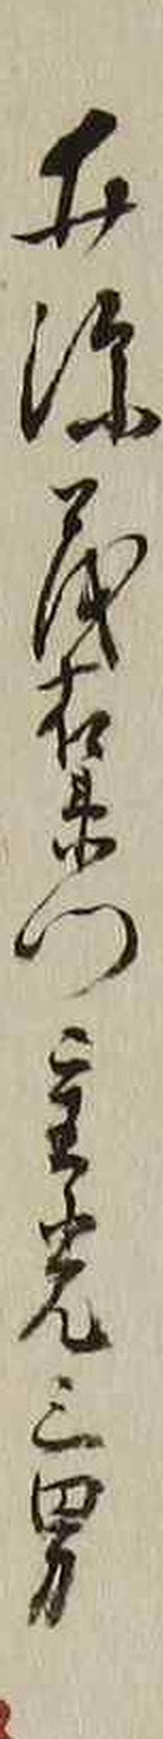井深茂右衛門重光三男
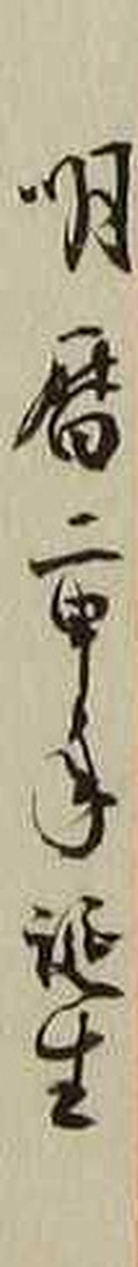明暦二申年誕生
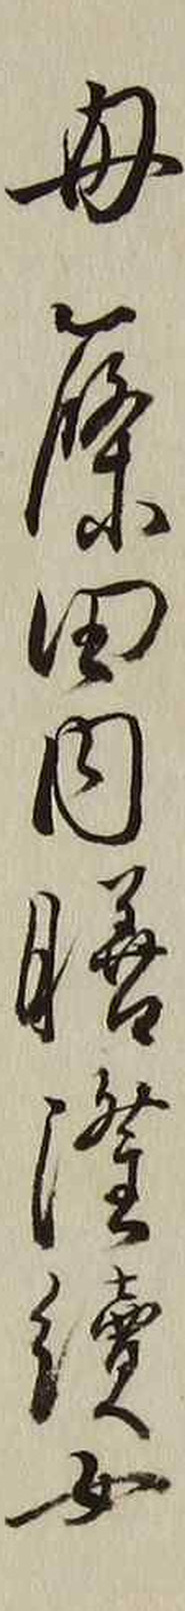母篠田内膳隆續女
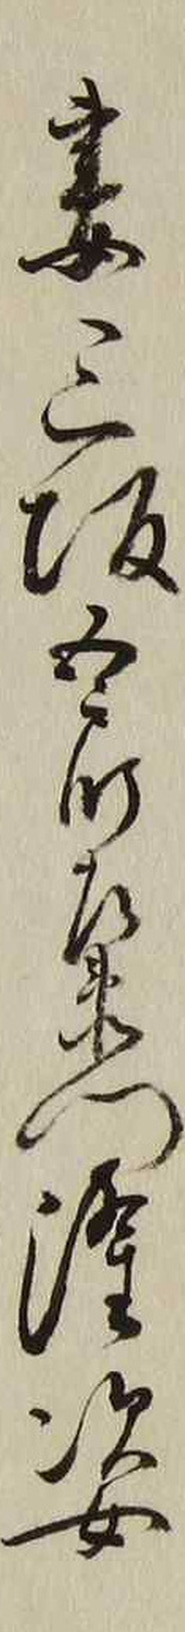妻三坂五郎左衛門隆次女
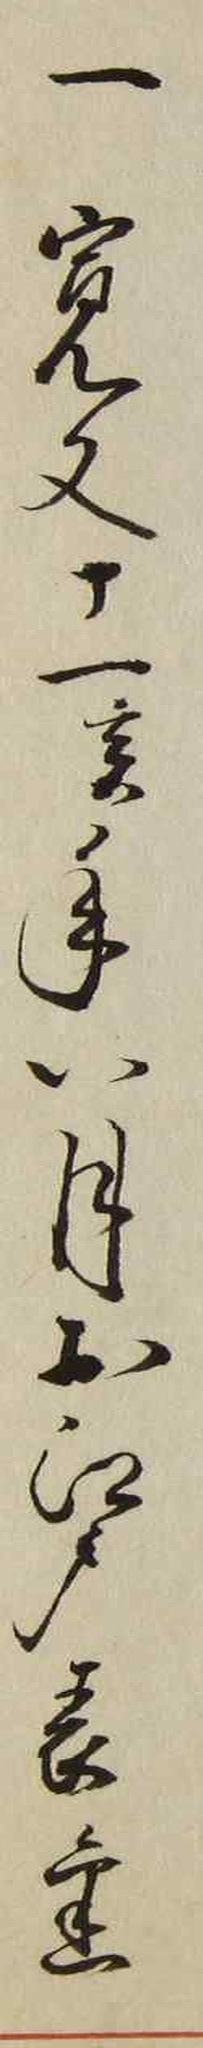一寛文十一亥年八月於江戸表金

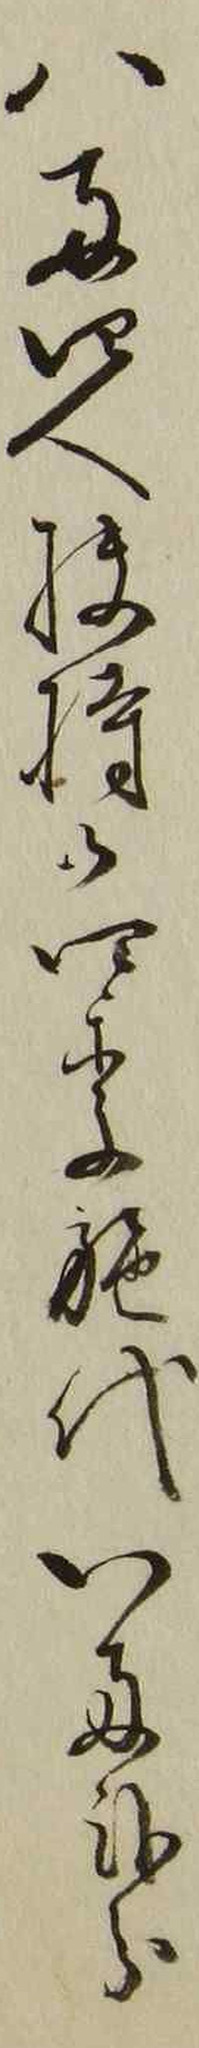八両四人扶持御四季施代八両弐分
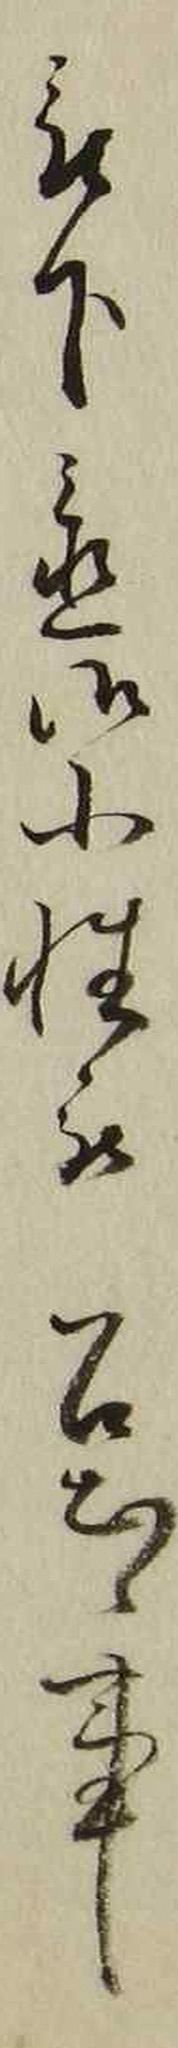被下置候小性被召出候事
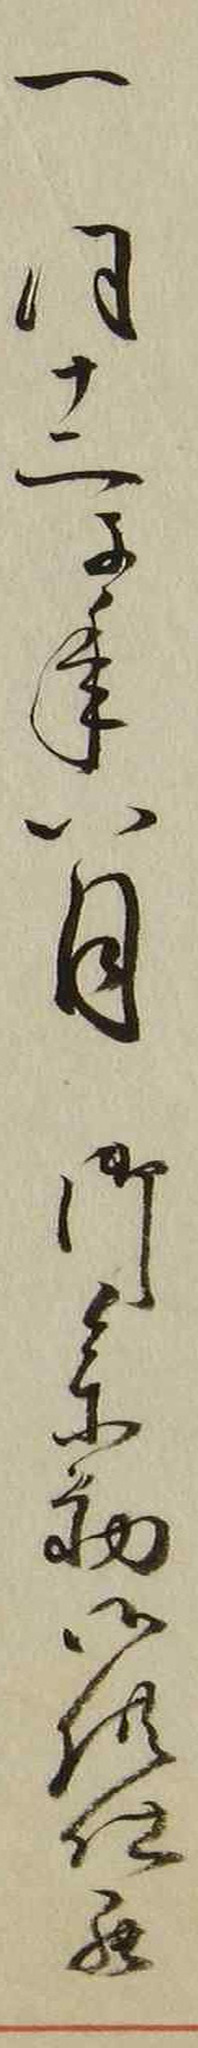一同十二子年八月御参勤御供仕罷
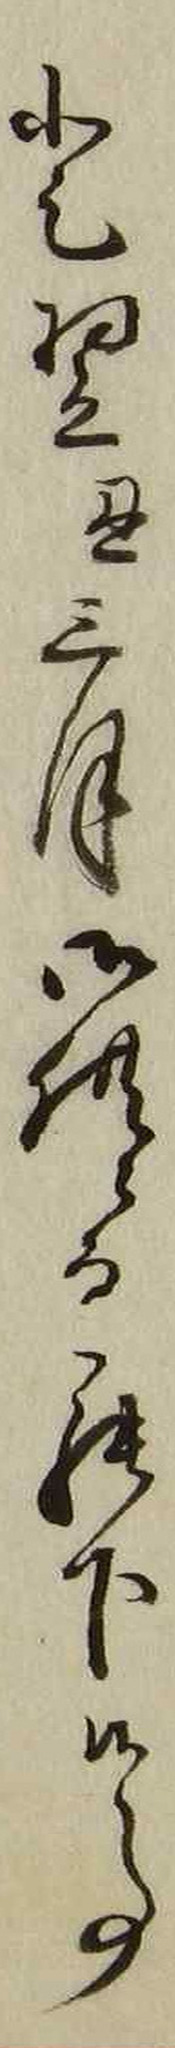登翌丑三月御供ニ而罷下候事
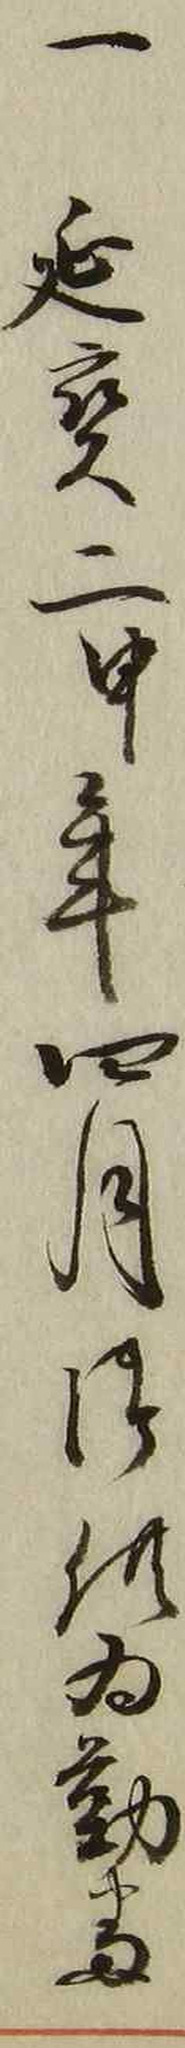一延宝二申年四月御供為勤番
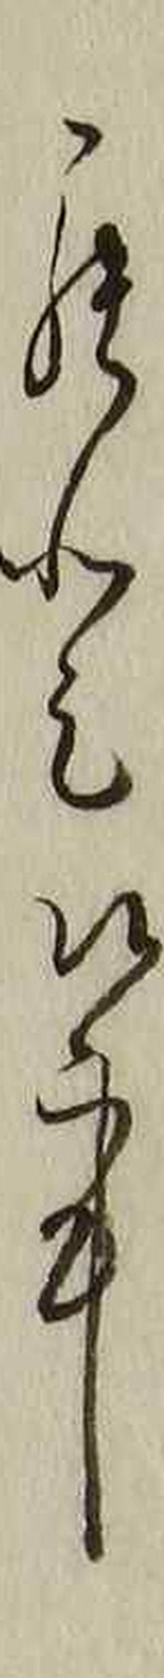罷登候事
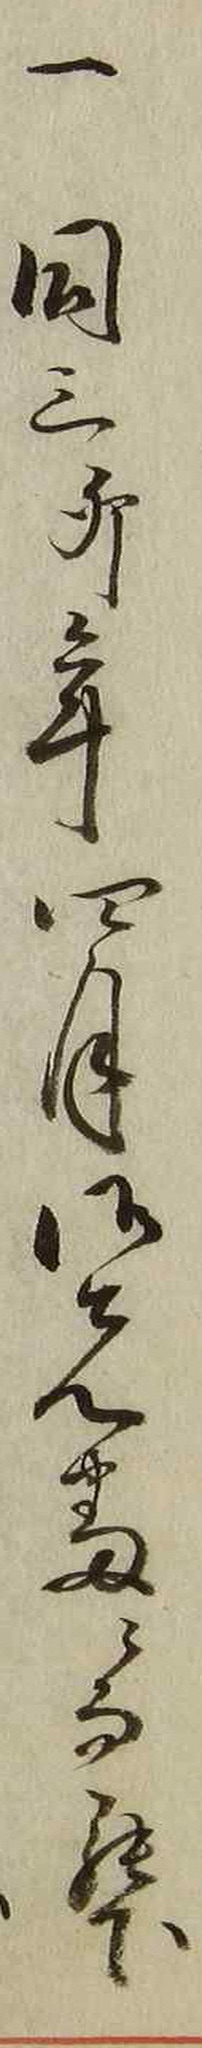一同三卯年四月御先番ニ而罷下
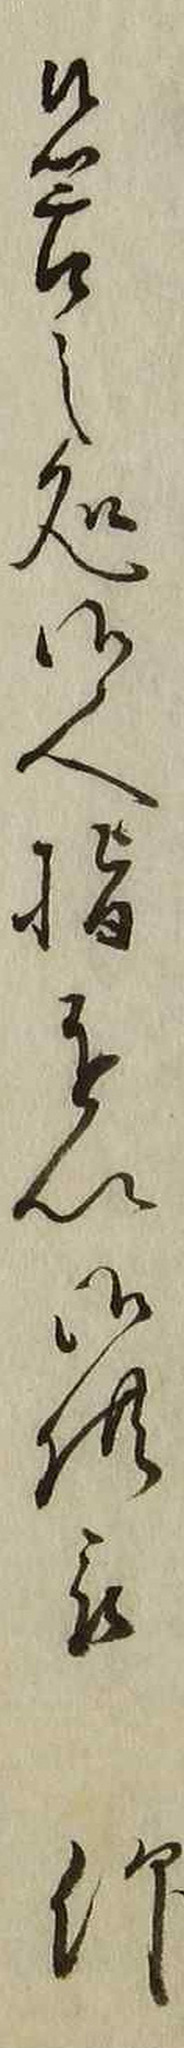候筈之処御人指を以御供被仰
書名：諸士系譜　巻之2　い之部2
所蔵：会津若松市立会津図書館
